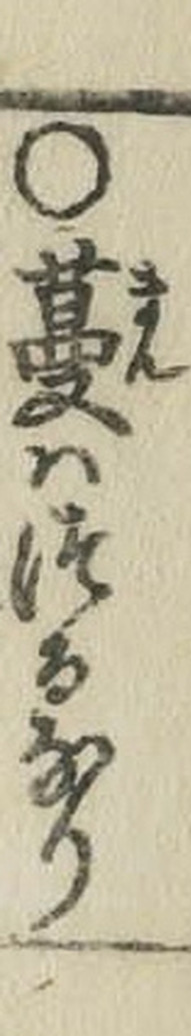○蔓はつるなり
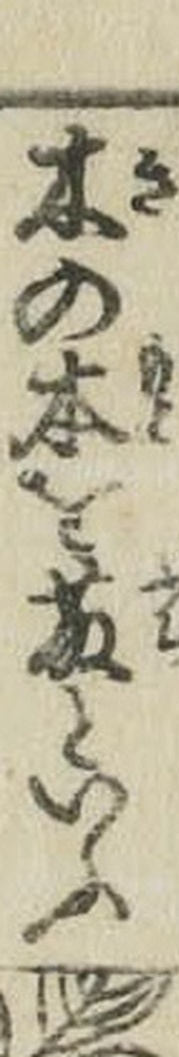木の本を藤といふ
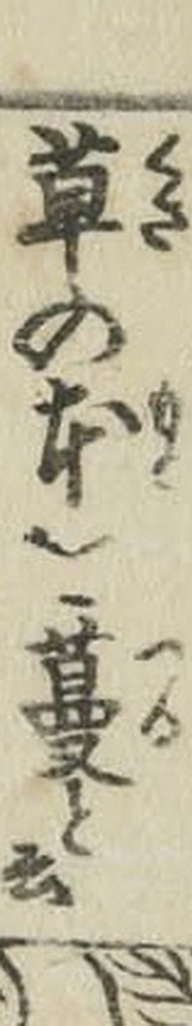草の本を蔓と云
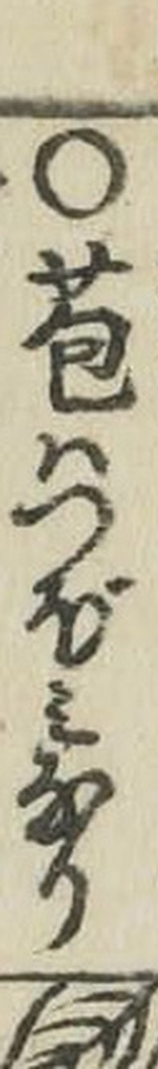○苞はつぼみなり
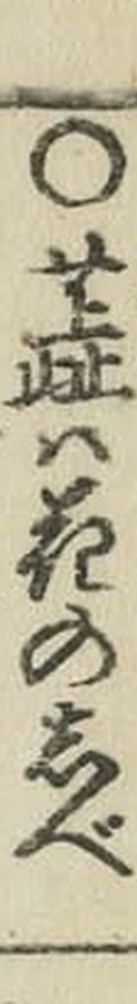○蕋は花のしべ
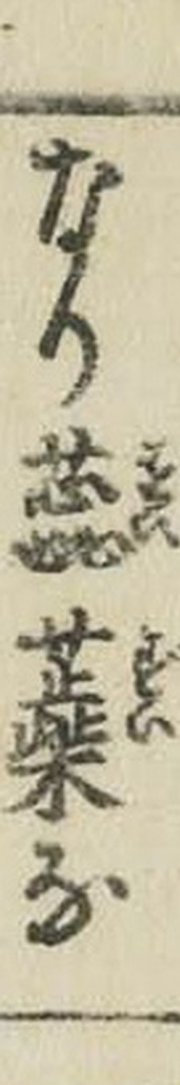なり蕊蘃な
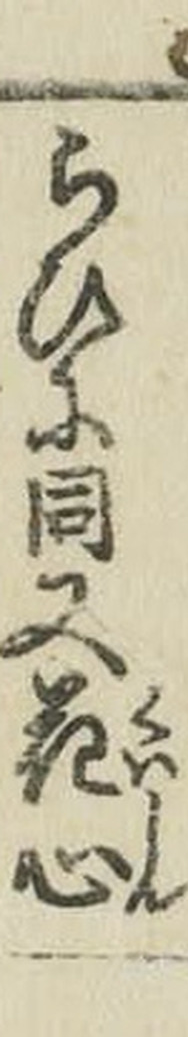らひに同又花心
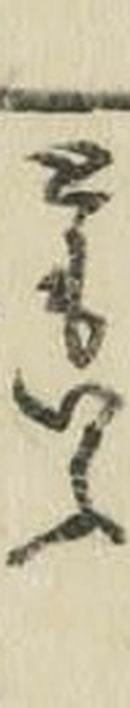ともいふ
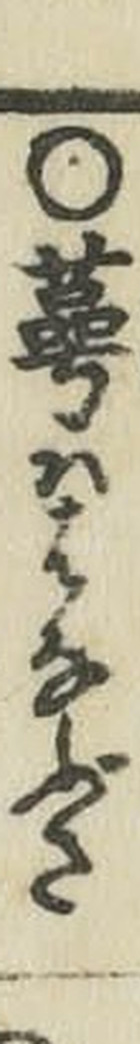○萼ははなぶさ
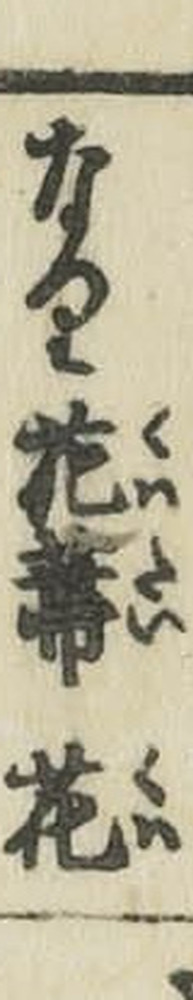なり花蔕花
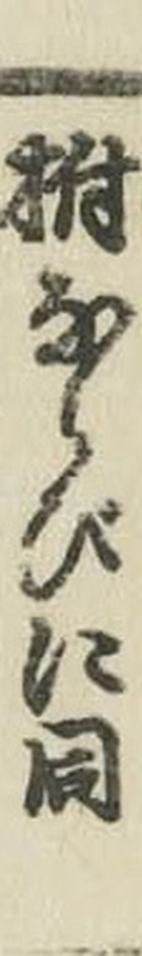柎ならびに同
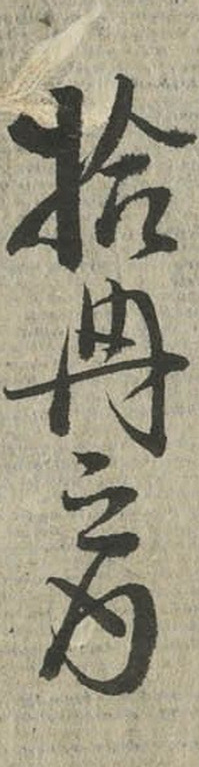拾冊之内
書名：増補頭書訓蒙図彙大成 10巻 9:巻之20
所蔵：東京学芸大学教育コンテンツアーカイブ
